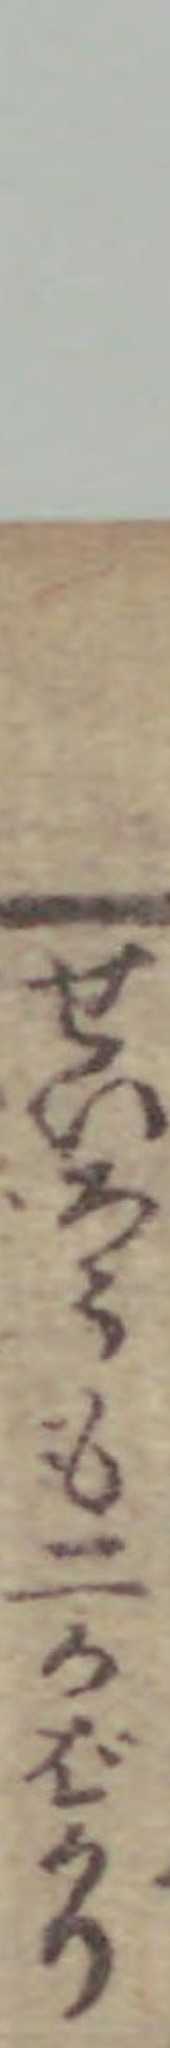せいろうも二かばかり
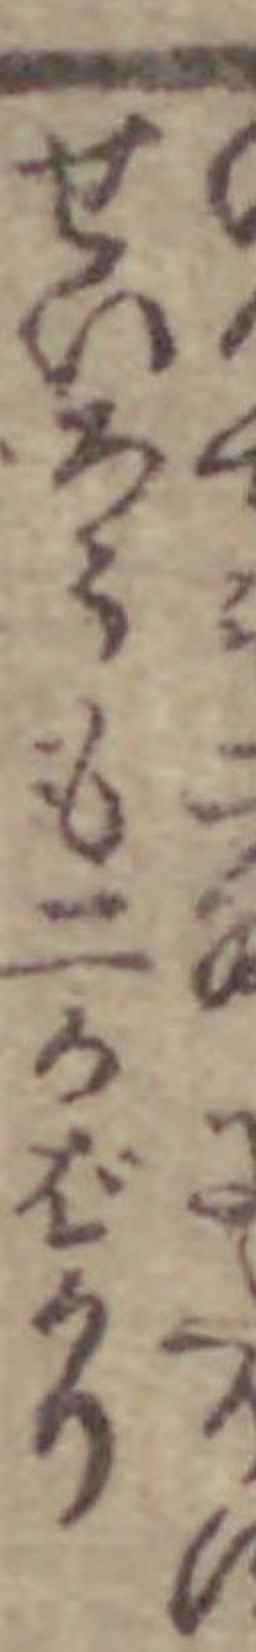せいろうも二かばかり
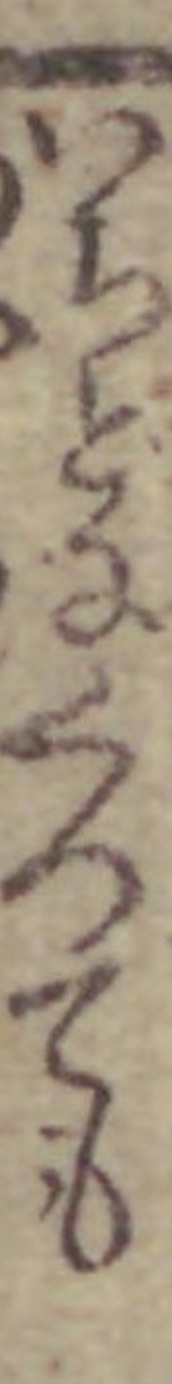いちどにくつても
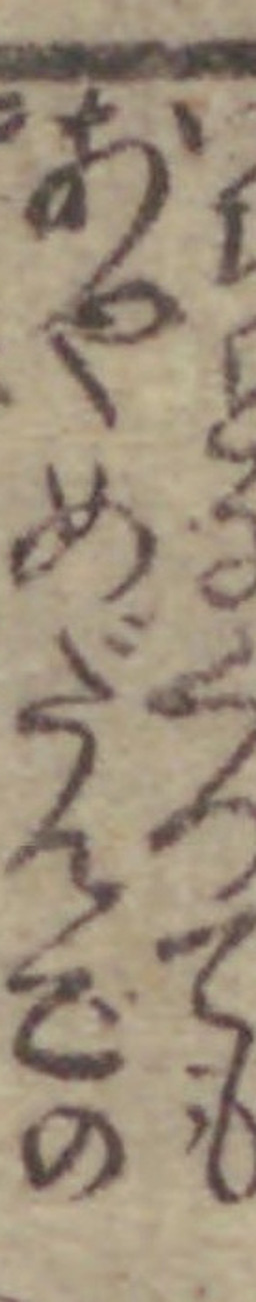あやめだんごの
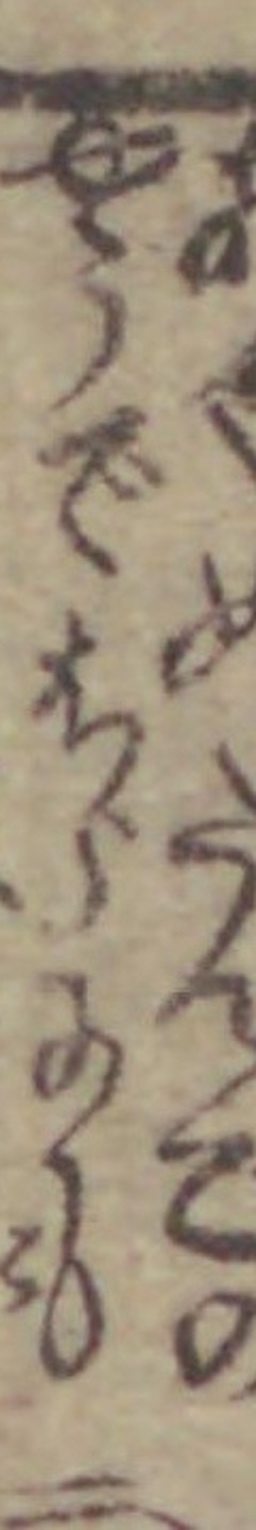やうではらにも
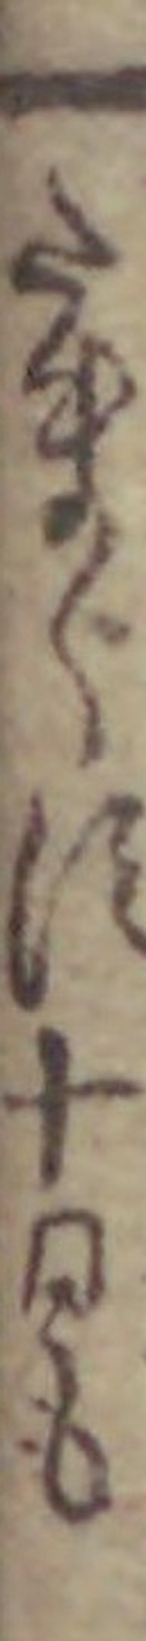たまらす十日も
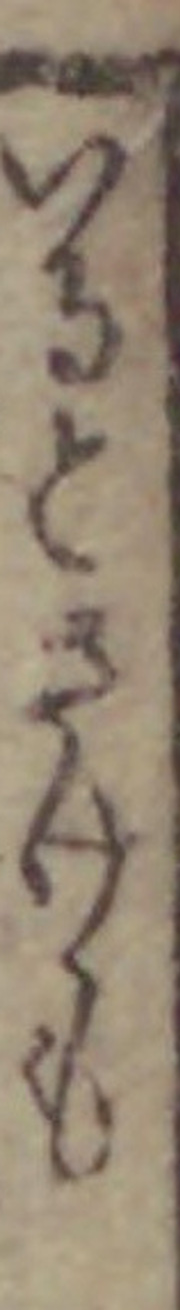いるとさけも
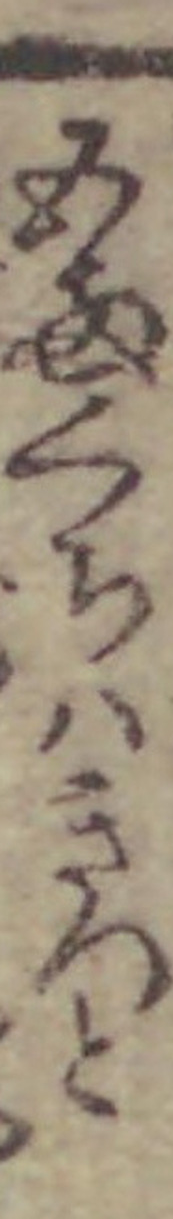五両くちはきつと
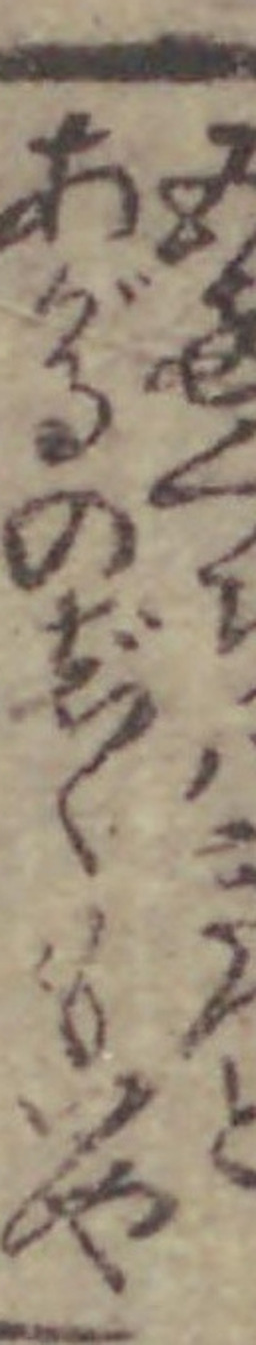あがるのじくもいや
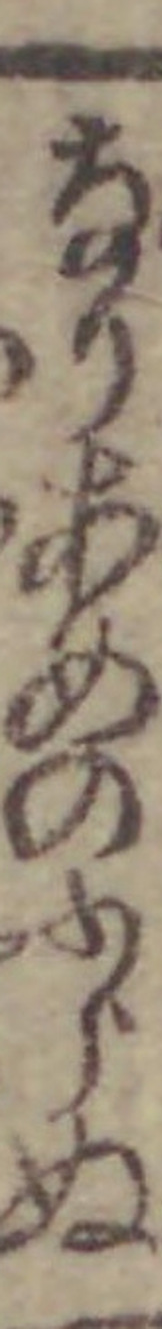なりあめのふらぬ
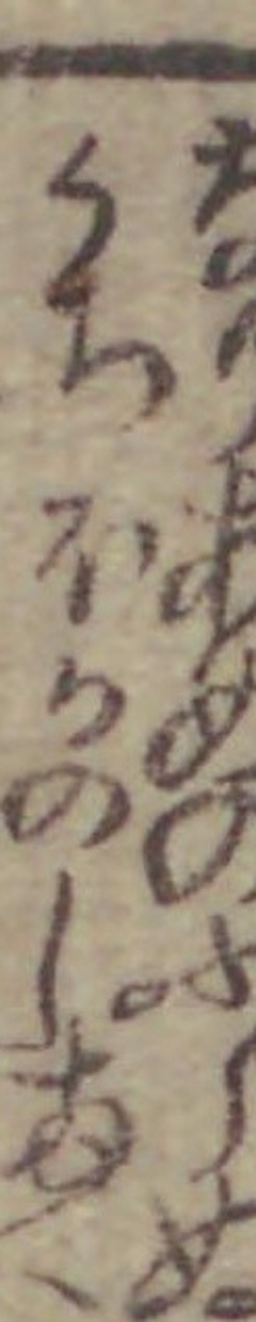うちほかのしまへ
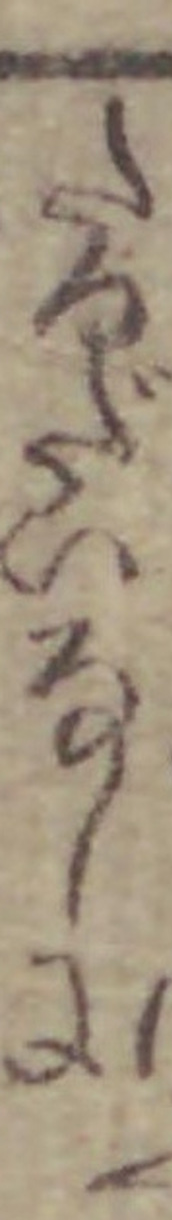たるだいなしに
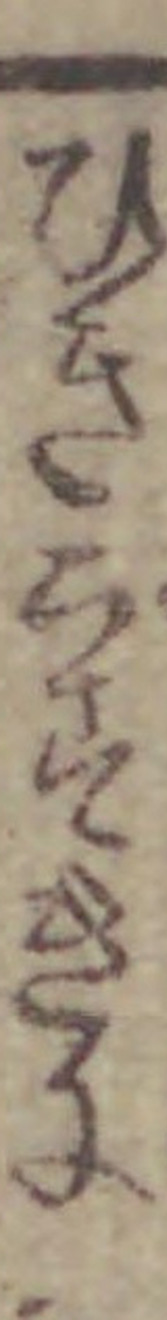ひきこすきに
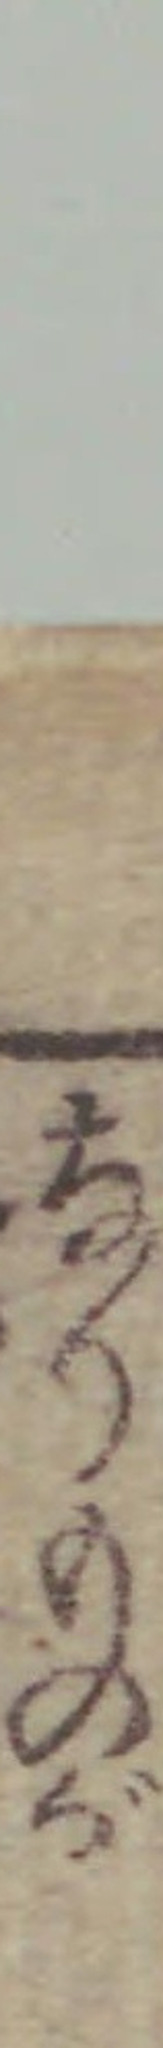なりものが
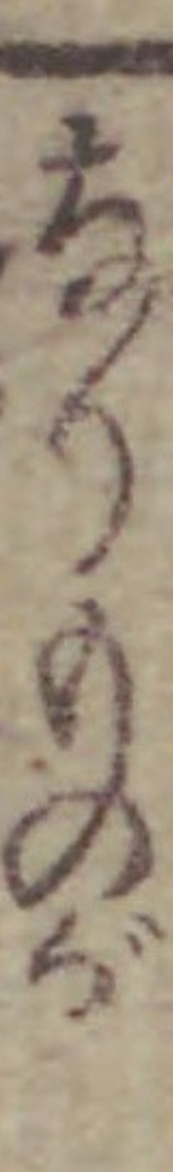なりものが
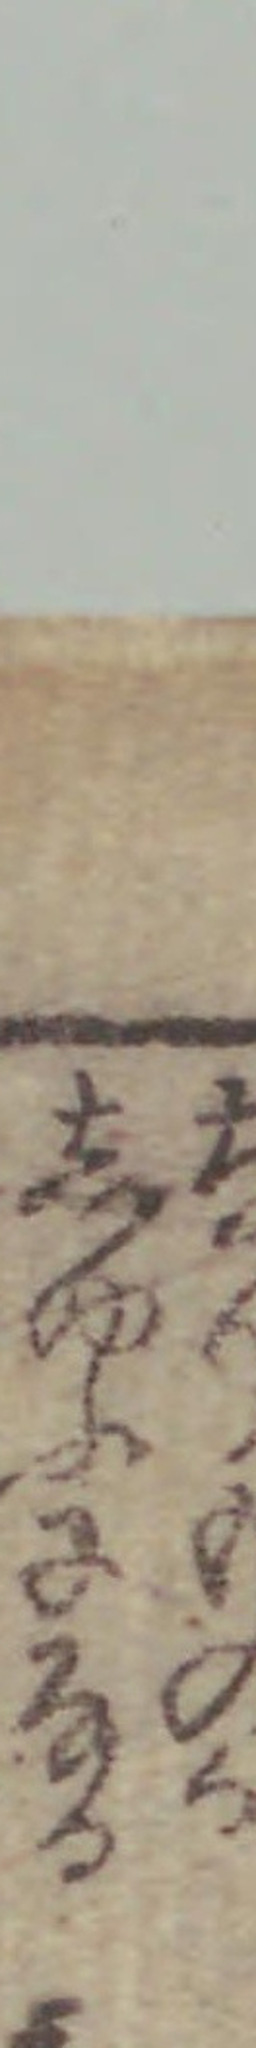しゆふになる
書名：近頃嶋めぐり 3巻
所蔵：国立国会図書館 National Diet Library, JAPAN
